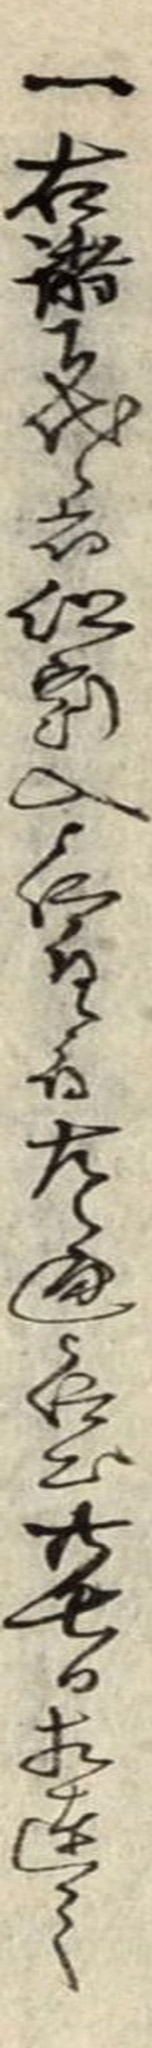一右諸下代之者組割入被仰付候に付左之通被仰出廿七日相達之
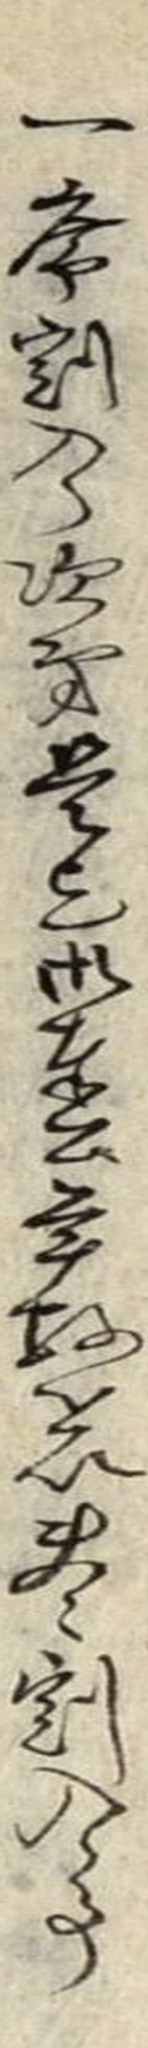一席割入候次第是迄御奉公年数を以夫々割入候事
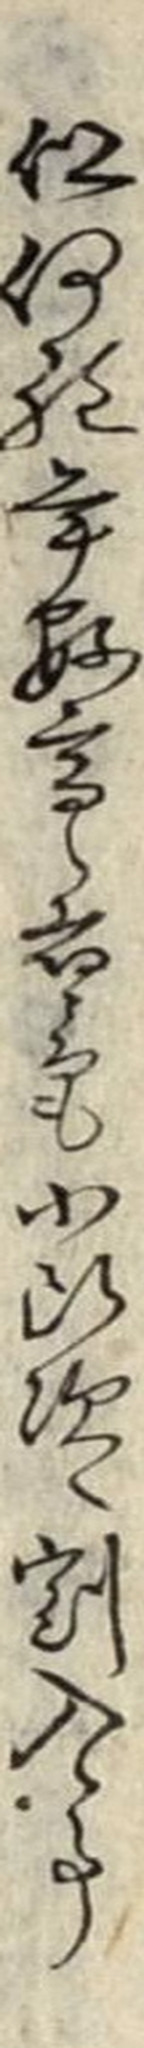但何程年数高候者に而も小頭次へ割入候事
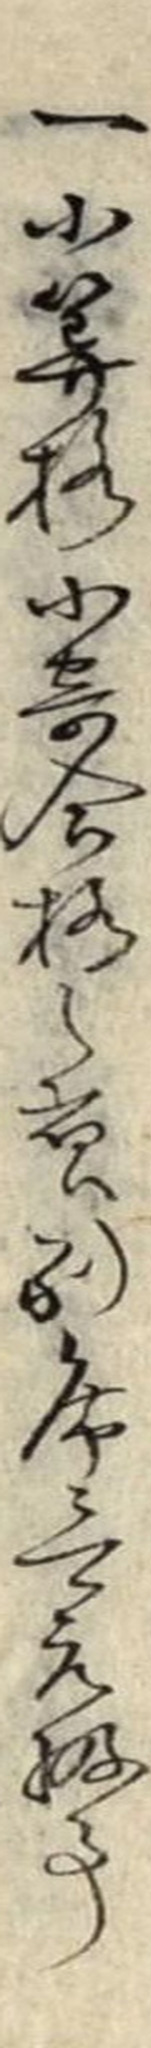一小算格小寄合格之者は別席に可取扱事
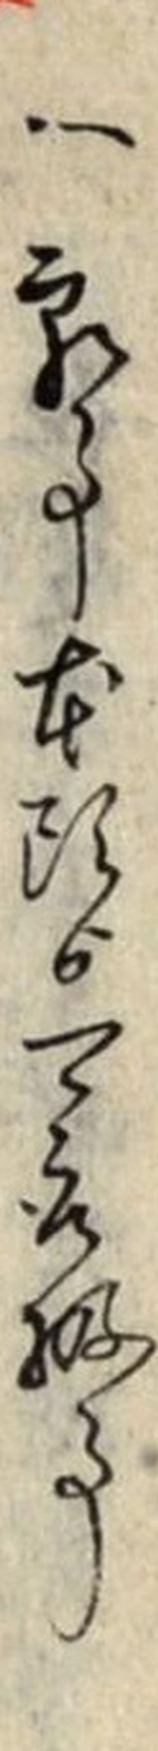一願事本頭ゟ可取扱事

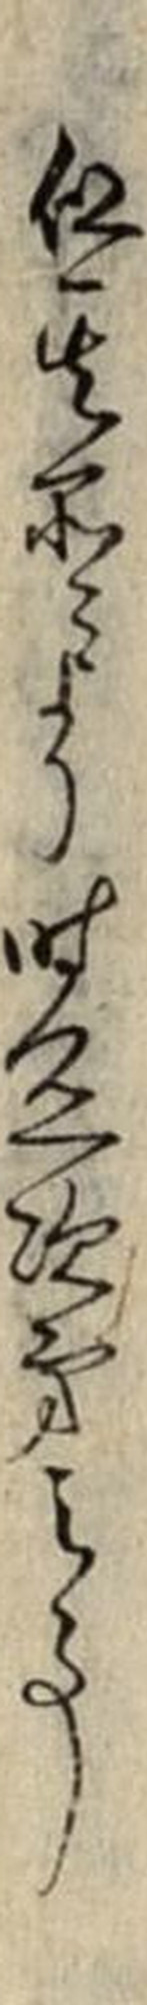但其品により時宜次第之事
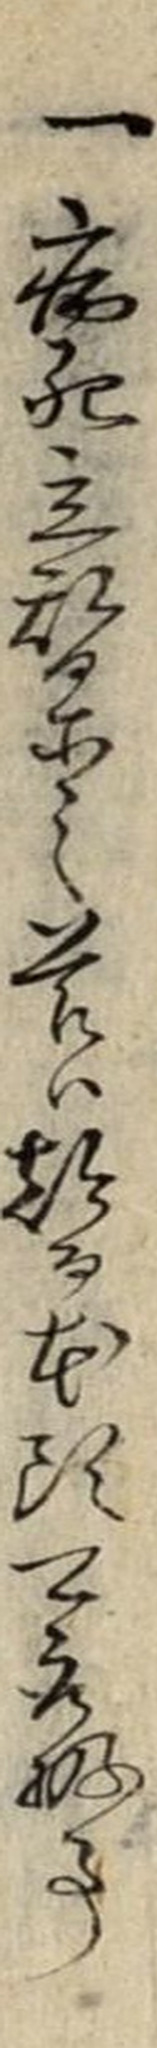一病死立替等之節は都而本頭可取扱事
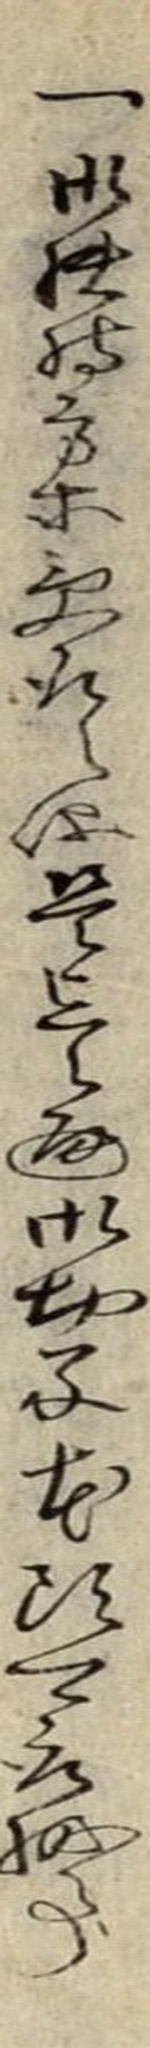一御扶持方等受取之儀是迄之通御切米本頭可取扱事
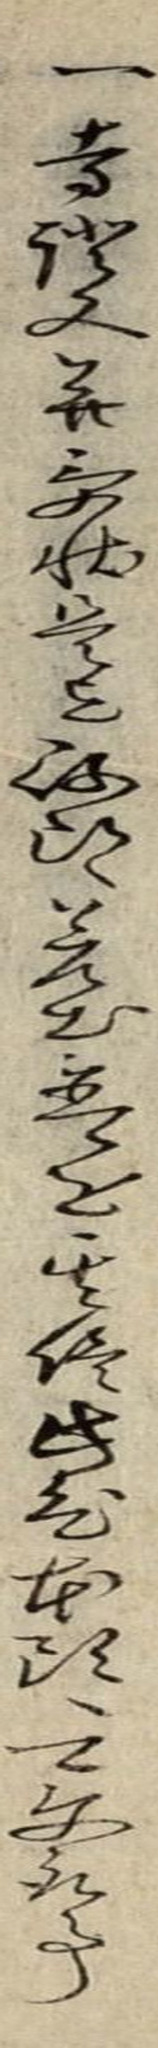一寺証文并受状是迄役頭へ差出置候を其侭此度本頭へ可受取事
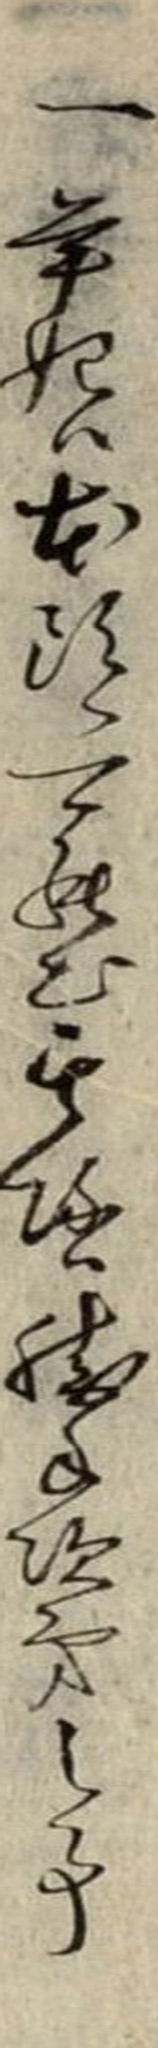一年始は本頭へ可罷出其餘は勝手次第之事
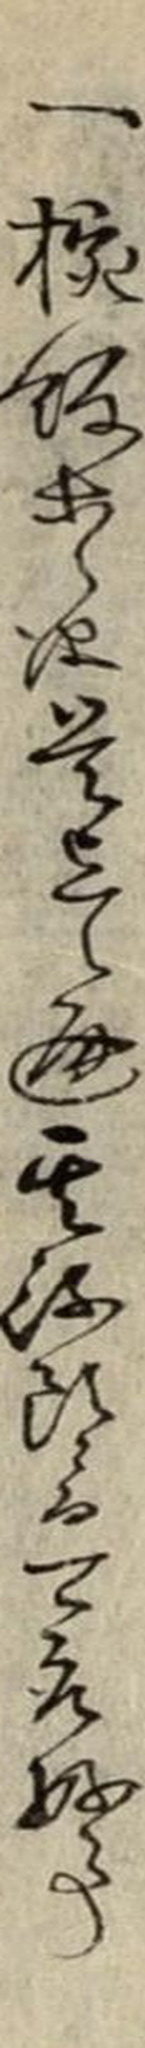一椀飯等之儀是迄之通其役頭に而可取扱事
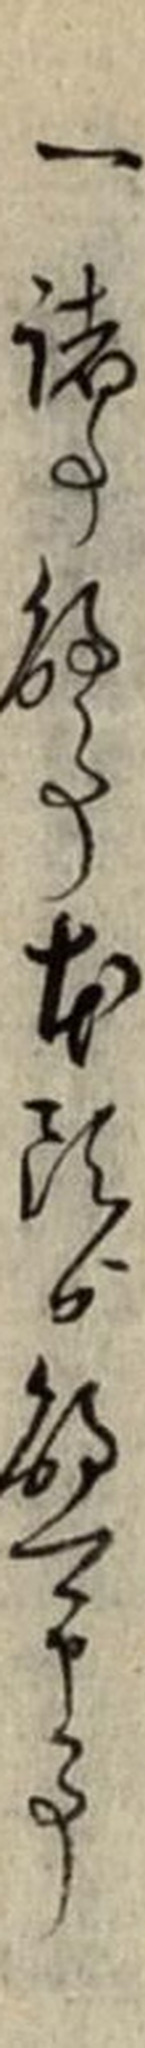一諸事触事本頭ゟ触可申事
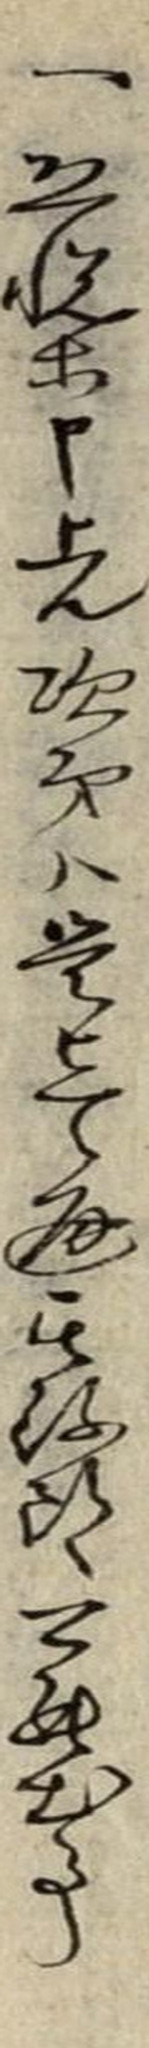一恐悦等申上ル次第は是迄之通其役頭へ可罷出事
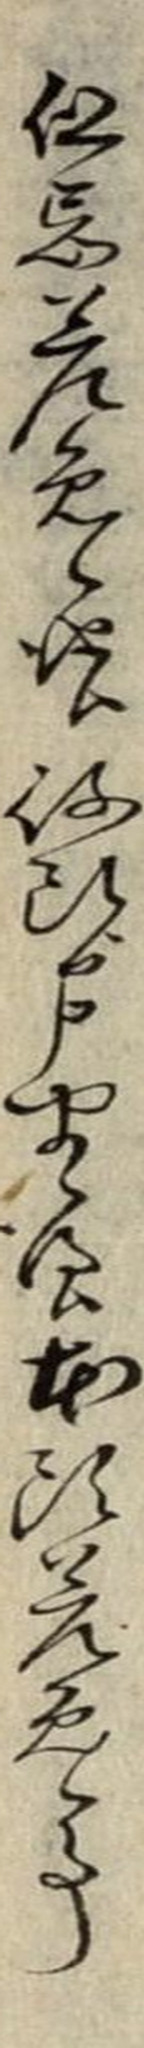但忌差免之儀は役頭ゟ申聞候得は本頭差免候事
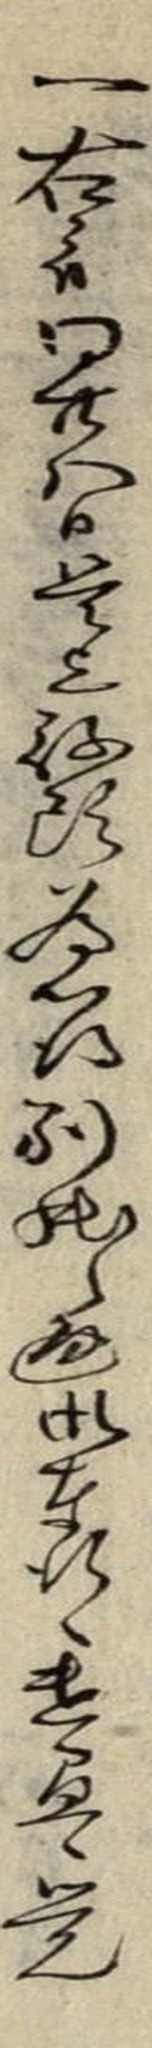一右に付同廿八日是迄役頭為心得別紙之通御奉行へ遣置候覚
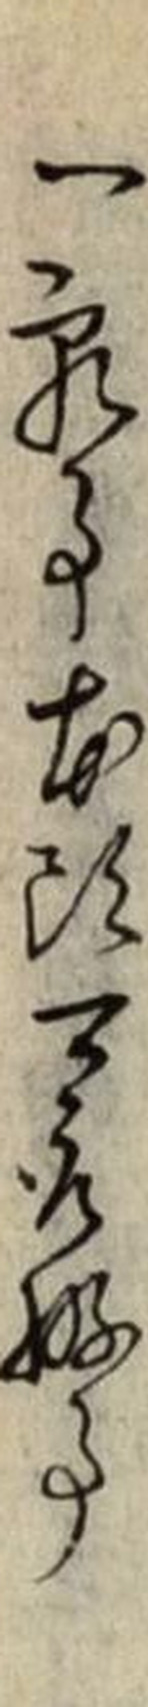一願事本頭可取扱事
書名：御用并被仰出之部
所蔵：福井県文書館 Fukui Prefectural Archives
